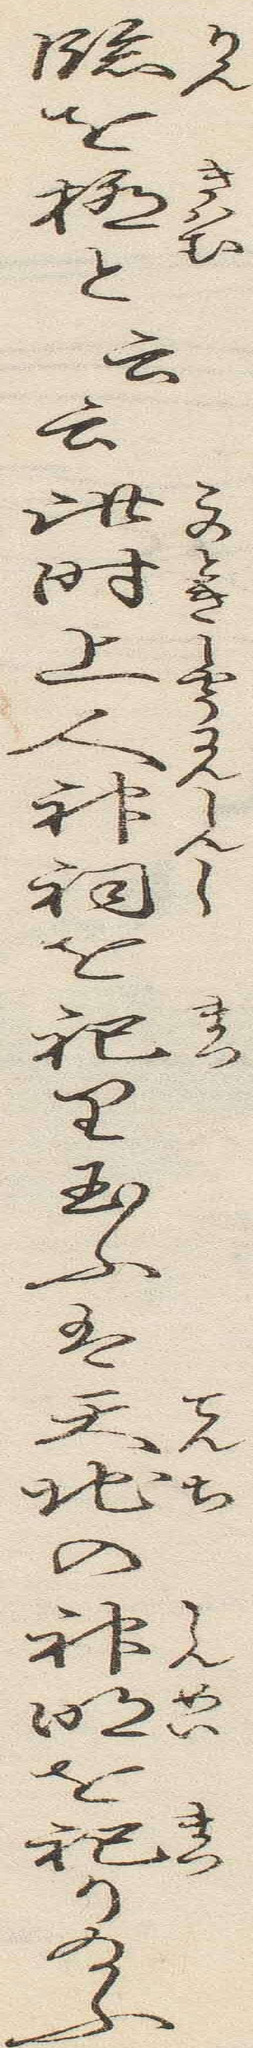臨を極と云云此时上人神祠を祀り玉ふは天地の神明を祀り給ふ
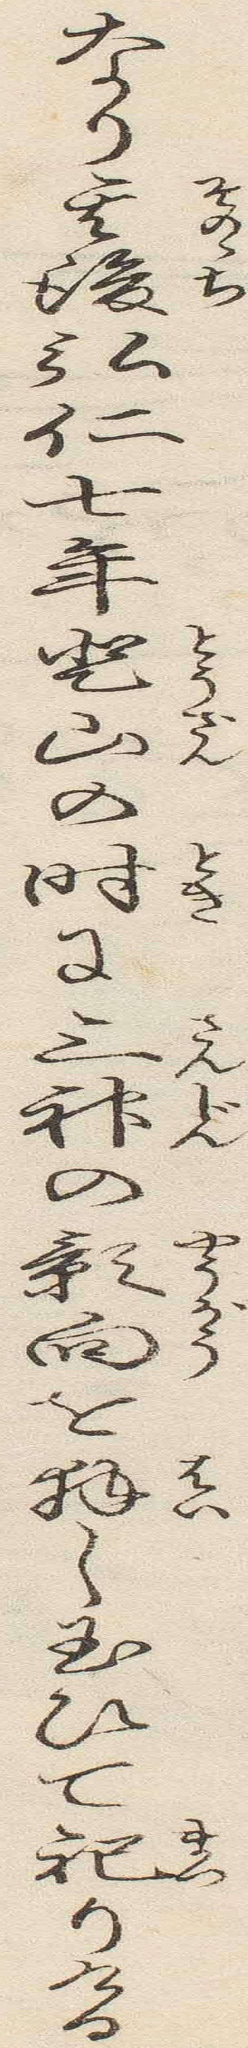なり其後弘仁七年登山の时に三神の影向を拝し玉ひて祀りける
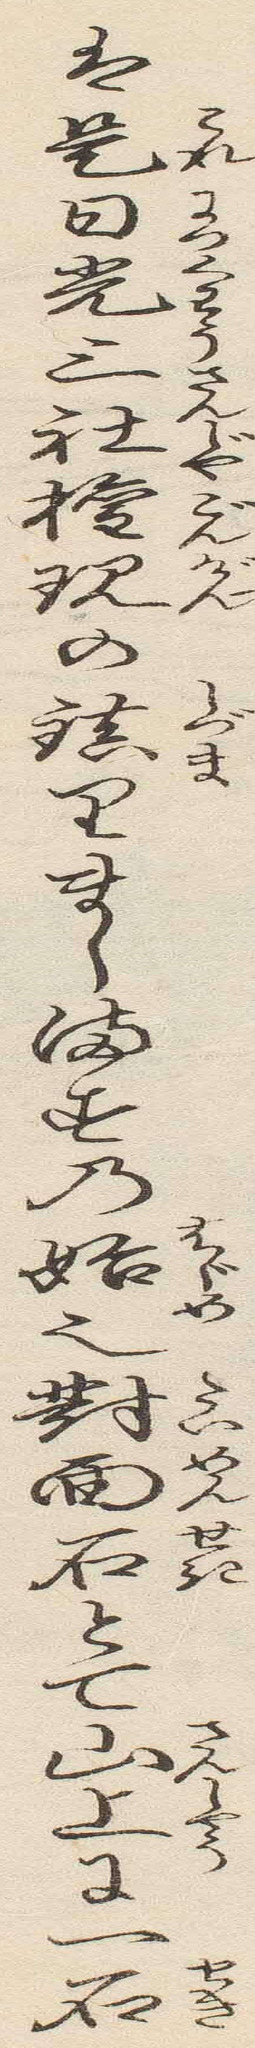は是日光三社權現の鎮りましますの始也對面石とて山上に一石
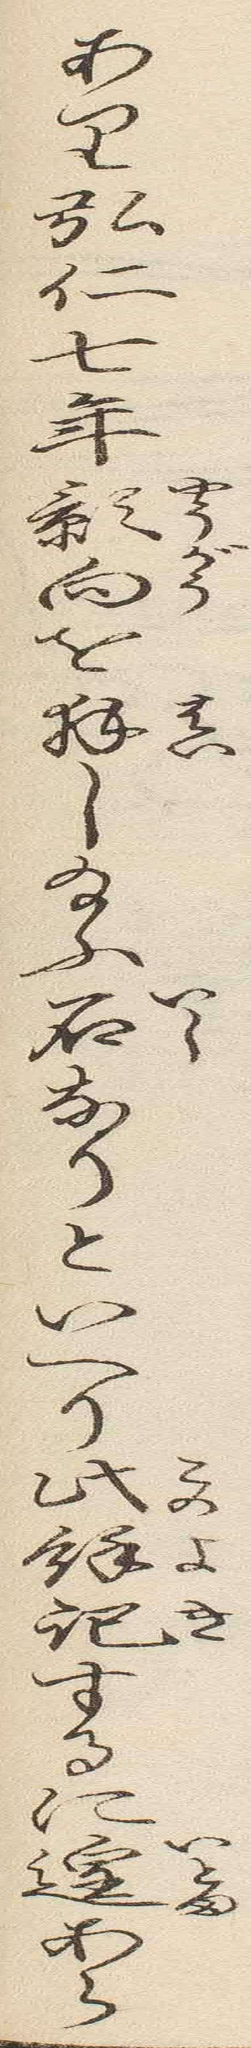あり弘仁七年影向を拝し給ふ石なりといへり此餘記するに遑あら
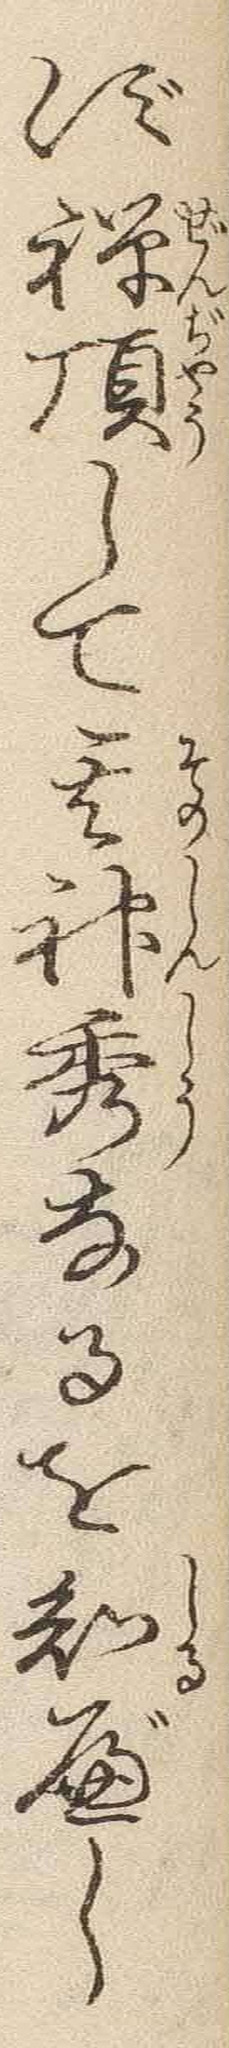ず禅頂して其神秀なるを知べし
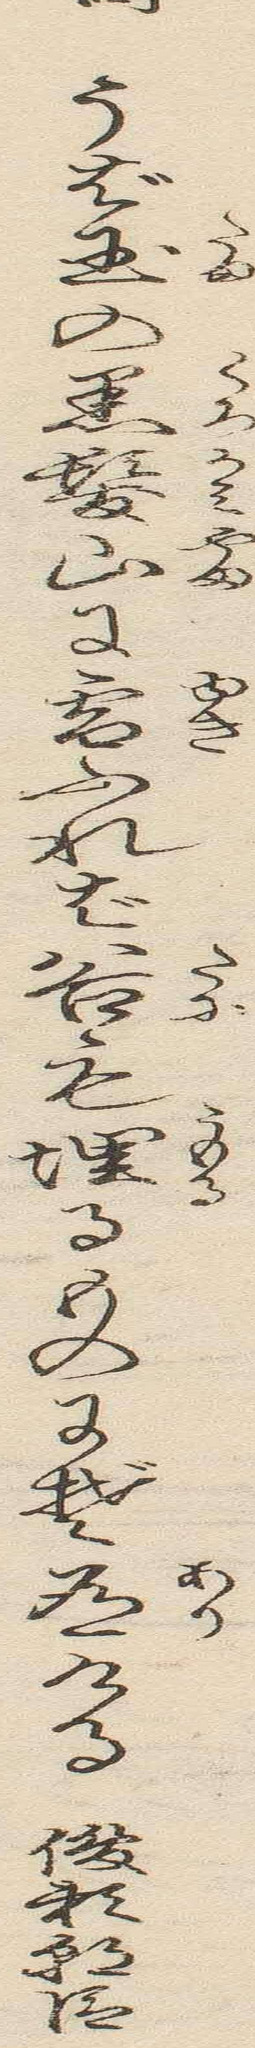同うば玉の黒髪山に雪ふれば谷も埋るものにぞ有ける俊頼朝臣
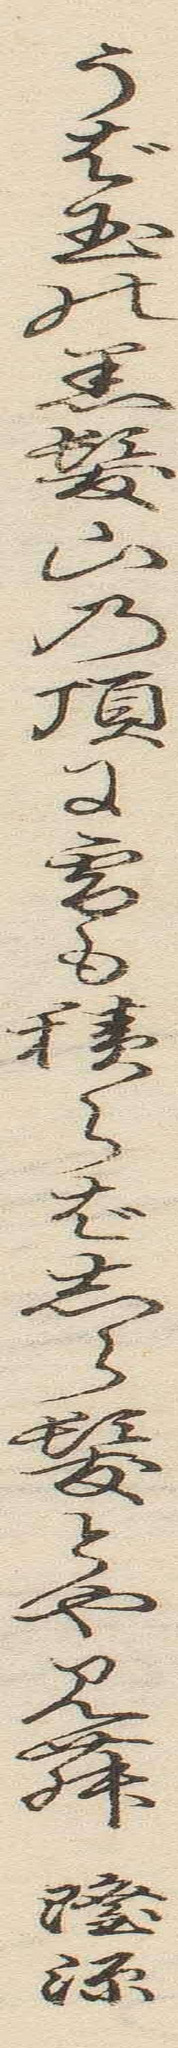うば玉の黒髪山の頂に雪も積らばすら髪とや見む隆源
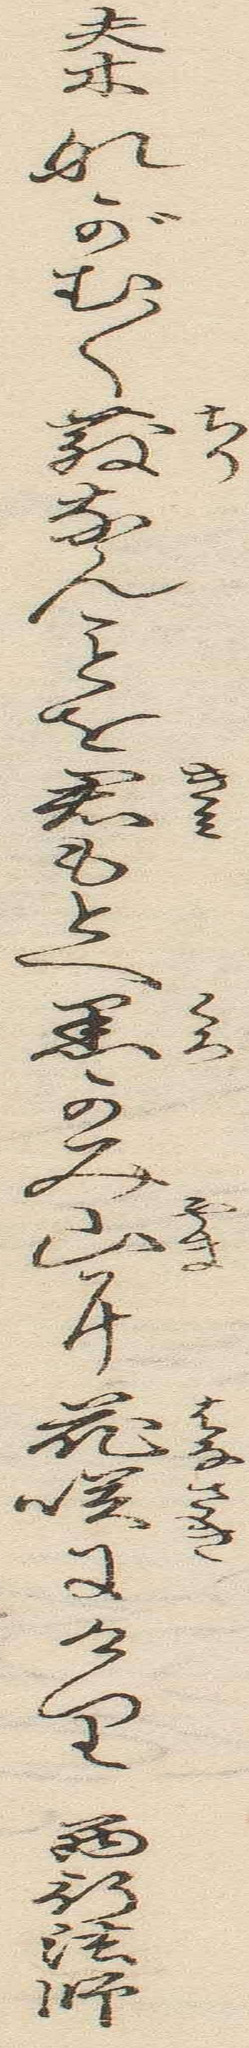夫木ながむ〳〵散なんことを君もとへ黒かみ山に花咲にけり西行法師
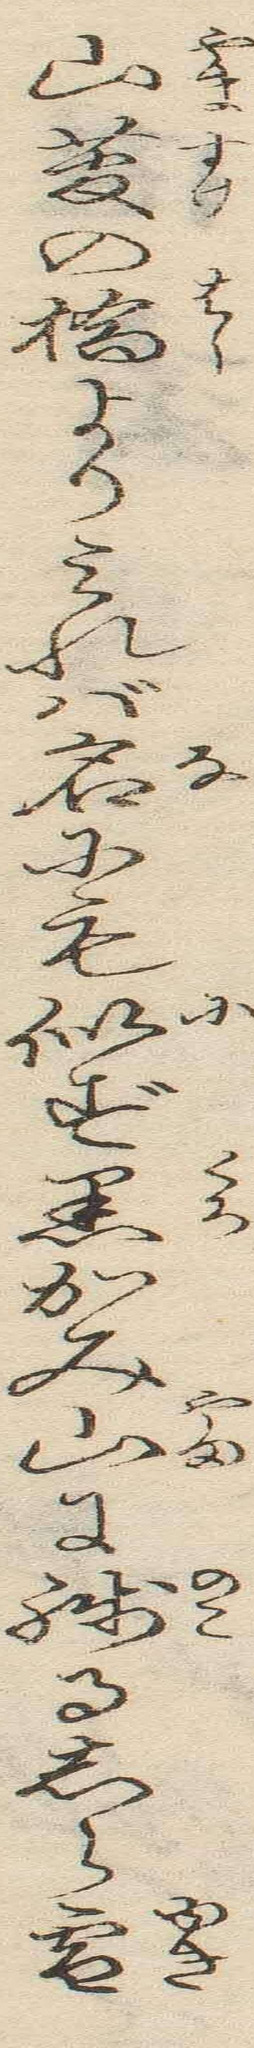山菅の橋よりみれば名にも似ず黒かみ山に残るしら雪
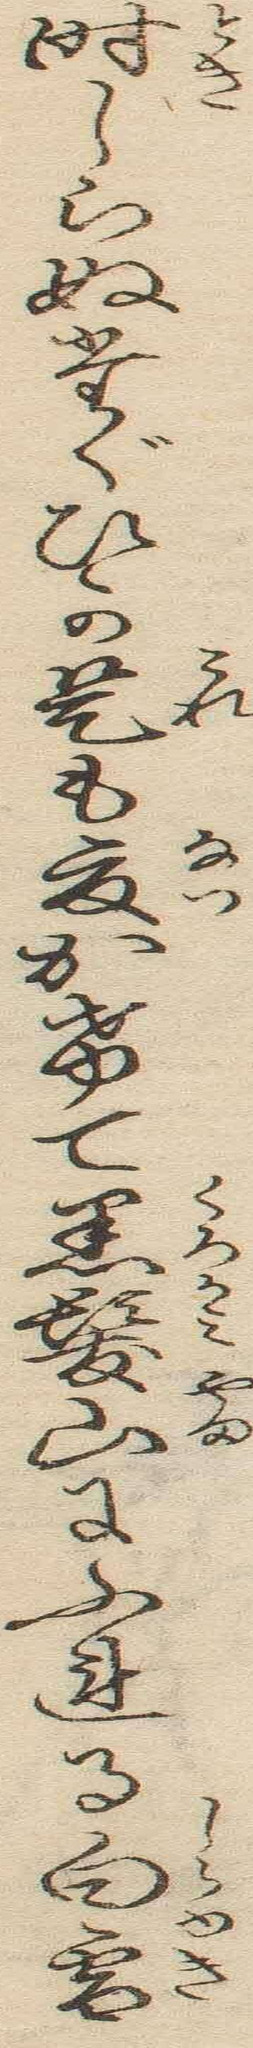时しらぬたぐいか是も夏かけて黒髪山にふれる白雪

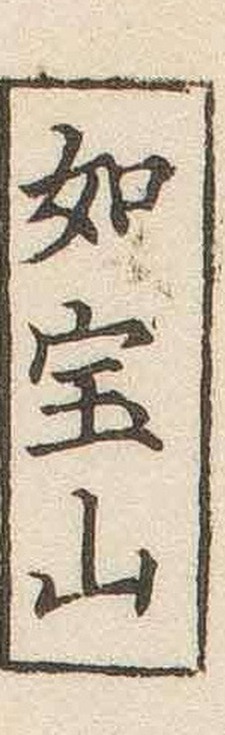如宝山
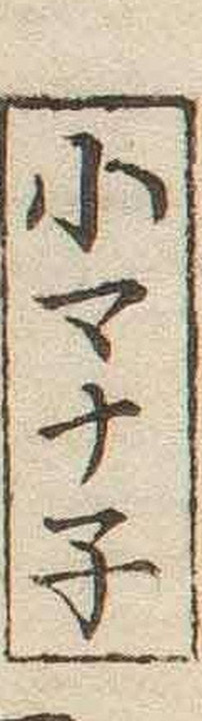小マナ子

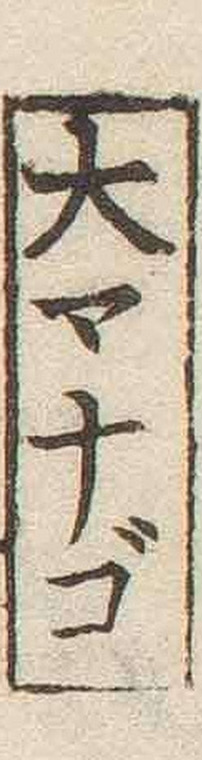大マナゴ
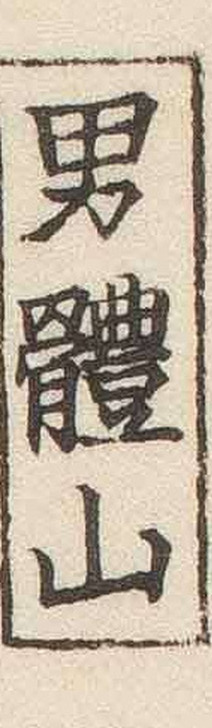男體山
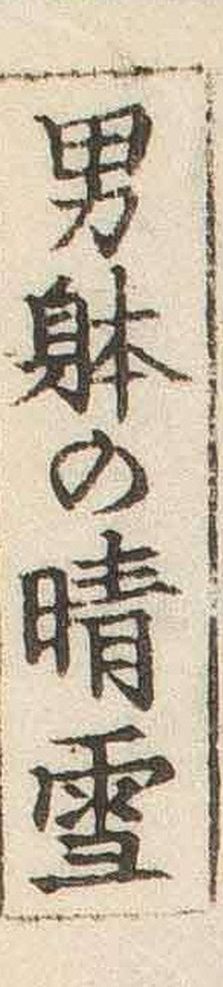男躰の晴雪

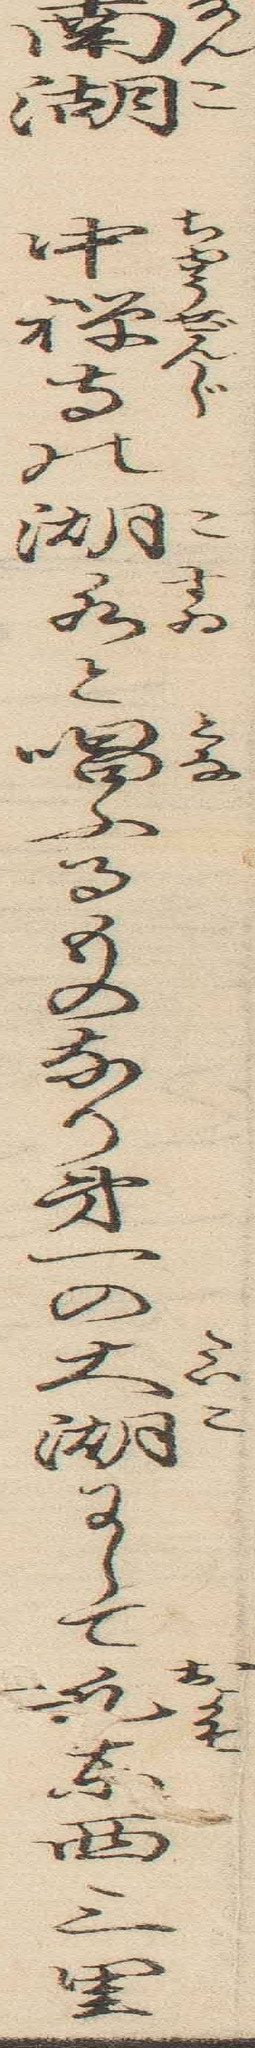南湖中禅寺の湖水と唱ふるものなり㐧一の大湖にして凢東西三里
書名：日光山志
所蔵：東京学芸大学附属図書館 国文学研究資料館
